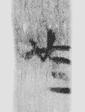{廿三}
